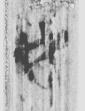女
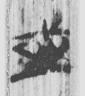或
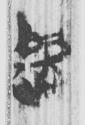臨
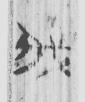我
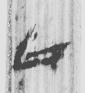㠯（以）
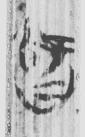智
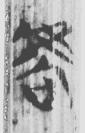唬
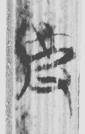皮
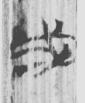{戈二}
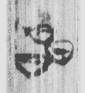晶
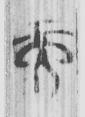而
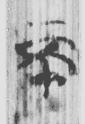不
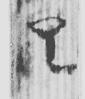巳
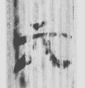亓
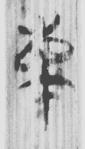柬
